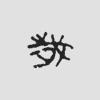歲
